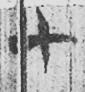七
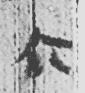六
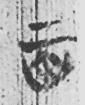百
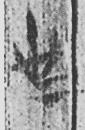卅=
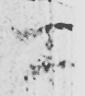五
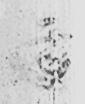百
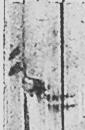六十=
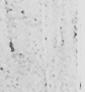四
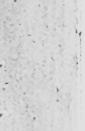百
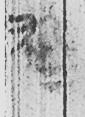九十=
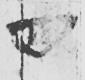四
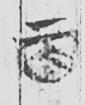百
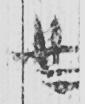廿=
